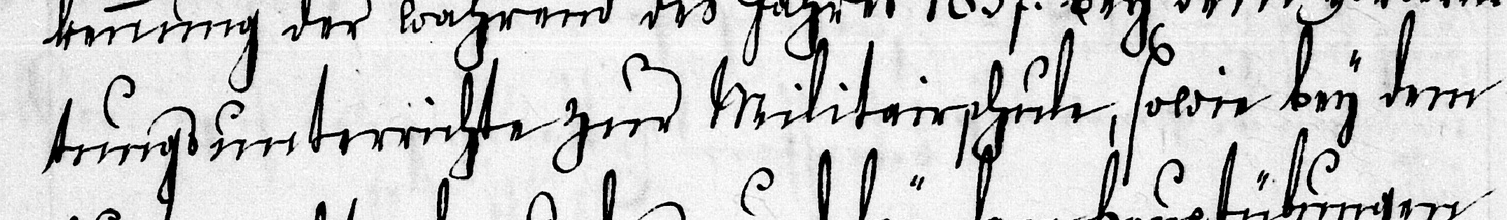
tungsunterrichte zur Militairschule, sowie bey dem
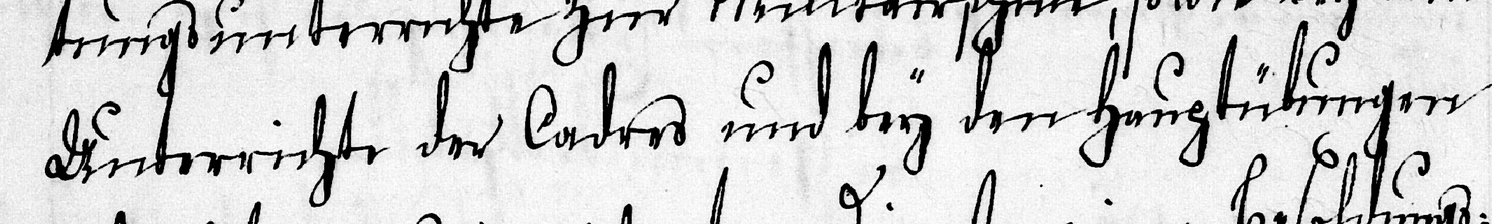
Unterrichte der Caders und bey den Hauptübungen
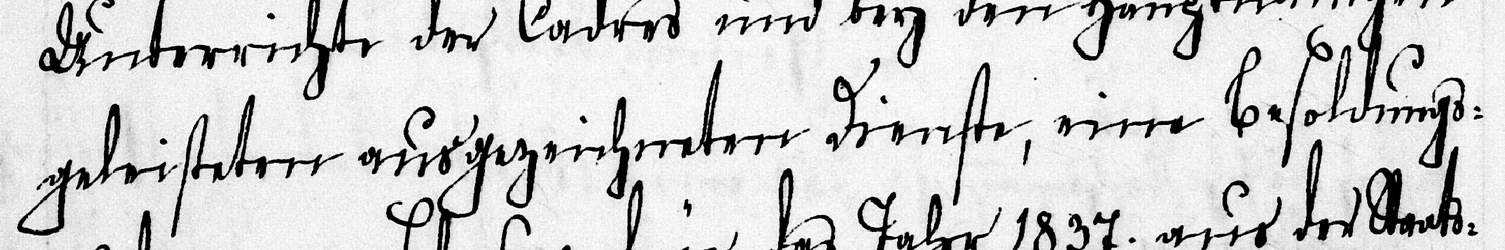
geleisteten ausgezeichneten Dienste, eine Besoldungs¬
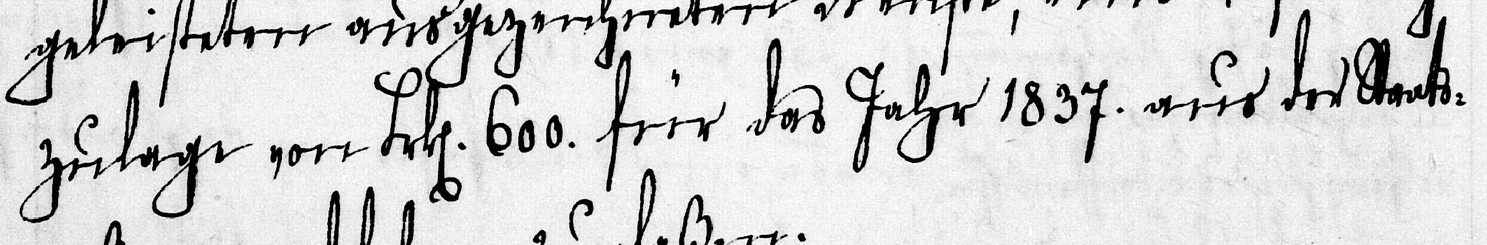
zulage von Frk[en]. 600. für das Jahr 1837. aus der Staat¬
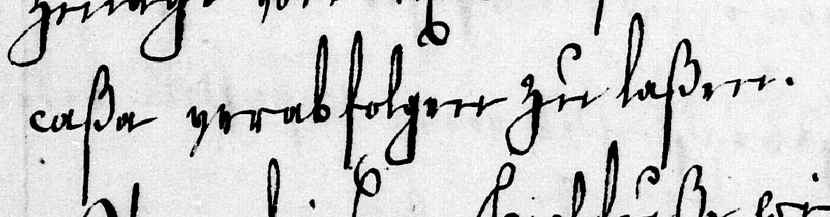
scaßa verabfolgen zu laßen.
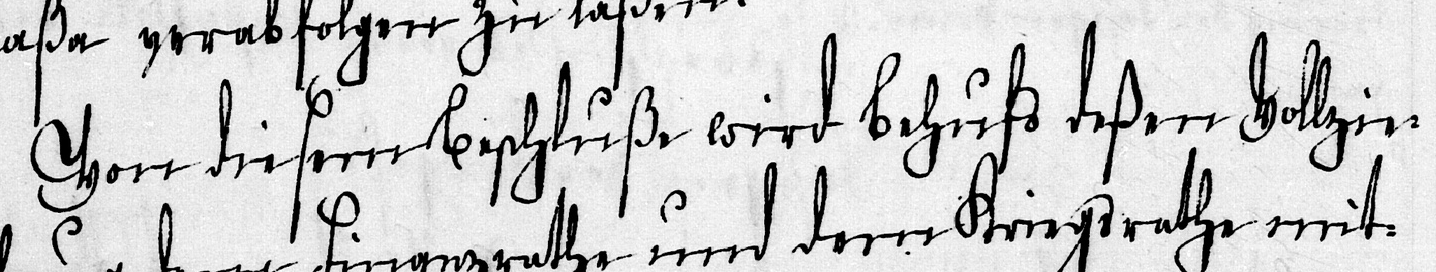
Von diesem Beschluße wird Behufs deßen Vollzi¬
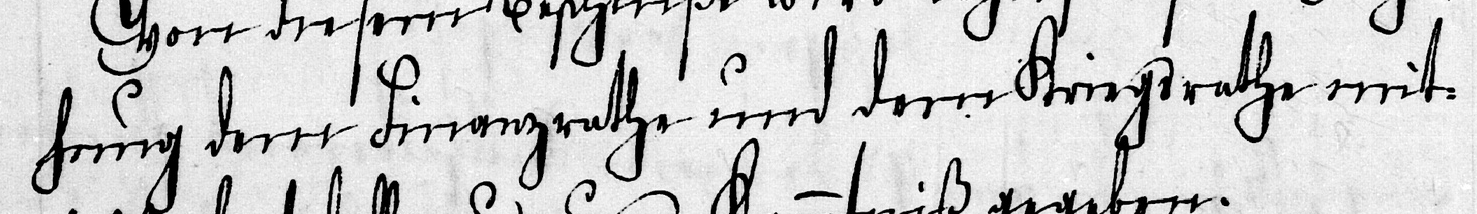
ehung dem Finanzrathe und dem Kriegsrathe mit¬
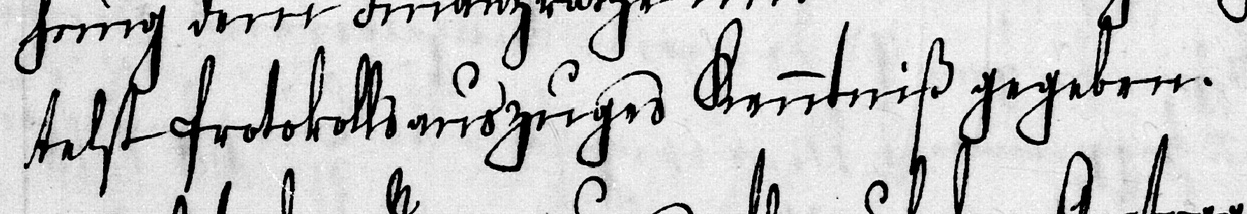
telst Protokollsauszuges Kenntniß gegeben.
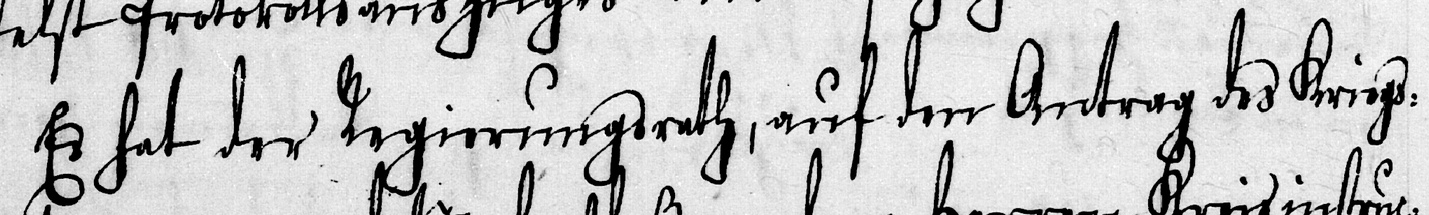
Es hat der Regierungsrath, auf den Antrag des Krieg¬
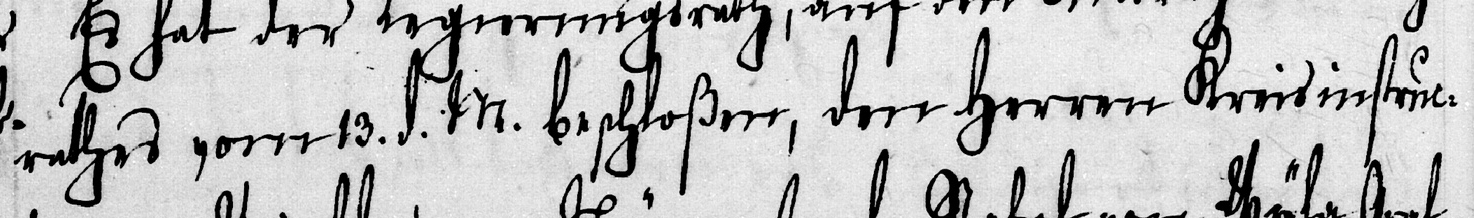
srathes vom 13. d. M. beschloßen, den Herren Kreisinstruc¬
